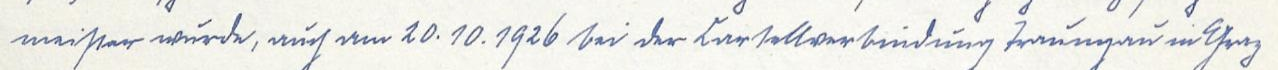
meister wurde, auch am 20.10.1926 bei der Cartellverbindung Traungau in Graz
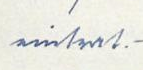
eintrat.
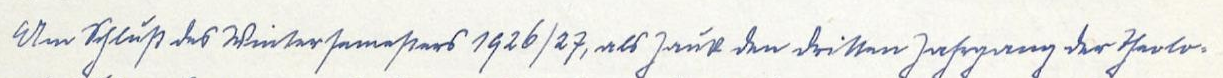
Am Schluß des Wintersemesters 1926 27, als Jauk den dritten Jahrgang der Theo-
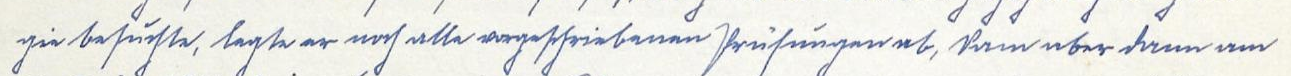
logie besuchte, legte er noch alle vorgeschriebenen Prüfungen ab, kam aber dann am
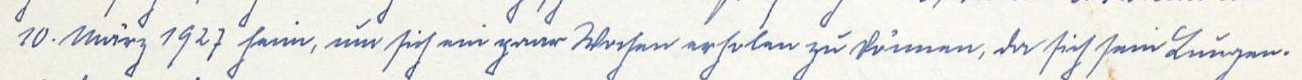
10. März 1927 heim, um sich ein paar Wochen erholen zu können, dass sich sein Lungen-
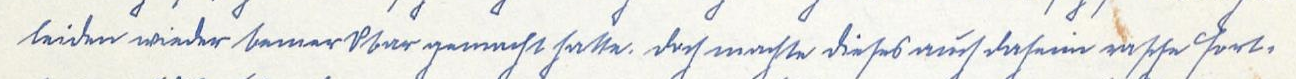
leiden wieder bemerkbar gemacht hatte. Doch machte dieses auch daheim rasche Fort-
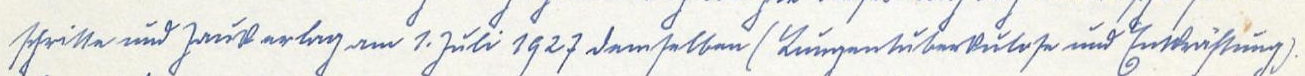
schritte und Jauk erlag am 1. Juli 1927 demselben (Lungentuberkulose und Entkräftung).
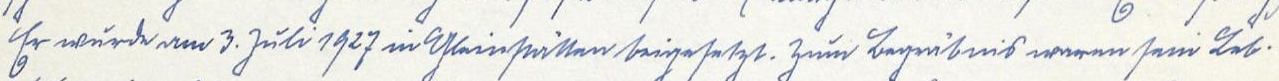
Er wurde am 3. Juli 1927 in Gleinstätten beigesetzt. Zum Begräbnis waren sein Leib-
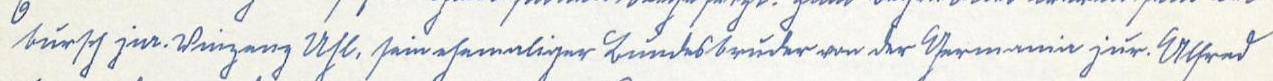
bursch jur. Vinzenz Uhl, sein ehemaliger Bundesbruder von der Germania jur. Alfred
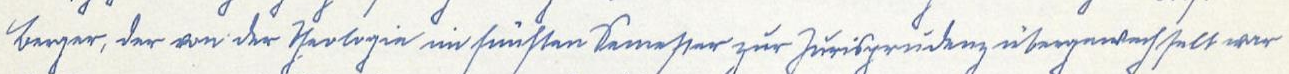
Berger, der von der Theologie im fünften Semester zur Jurisprudenz übergewechselt war
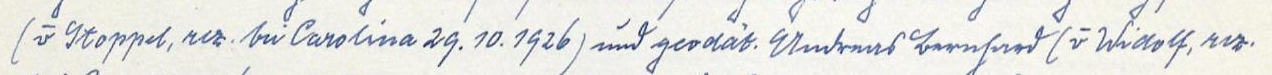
(v/o Stoppel, rez. bei Carolina 29.10.1926) und Geodät Andreas Bernhard (v/o Widolf, rez.
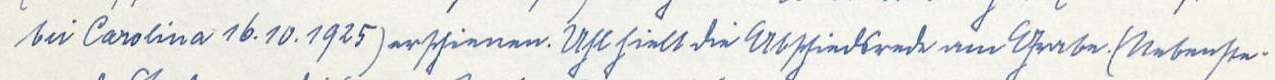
bei Carolina 16. 10. 1925) erschienen. Uhl hielt die Abschiedsrede am Grabe (Nebenste-
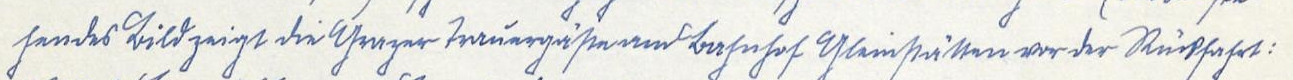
hendes Bild zeigt die Grazer Trauergäste am Bahnhof Gleinstätten vor der Rückfahrt:
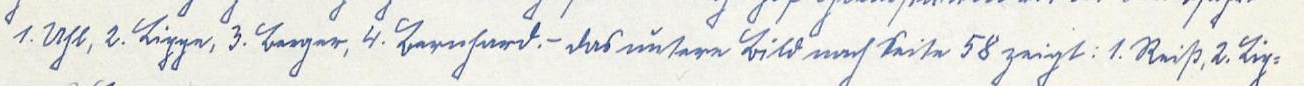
1. Uhl, 2. Lippe, 3. Berger, 4. Bernhard- Das untere Bild nach Seite 58 zeig: 1. Reiß, 2. Lip-pe, 3. Berger )
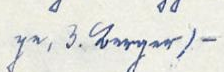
1) Er wirkte noch bis Weihnachten 1926 als Sänger am Grazer Domchor mit.
